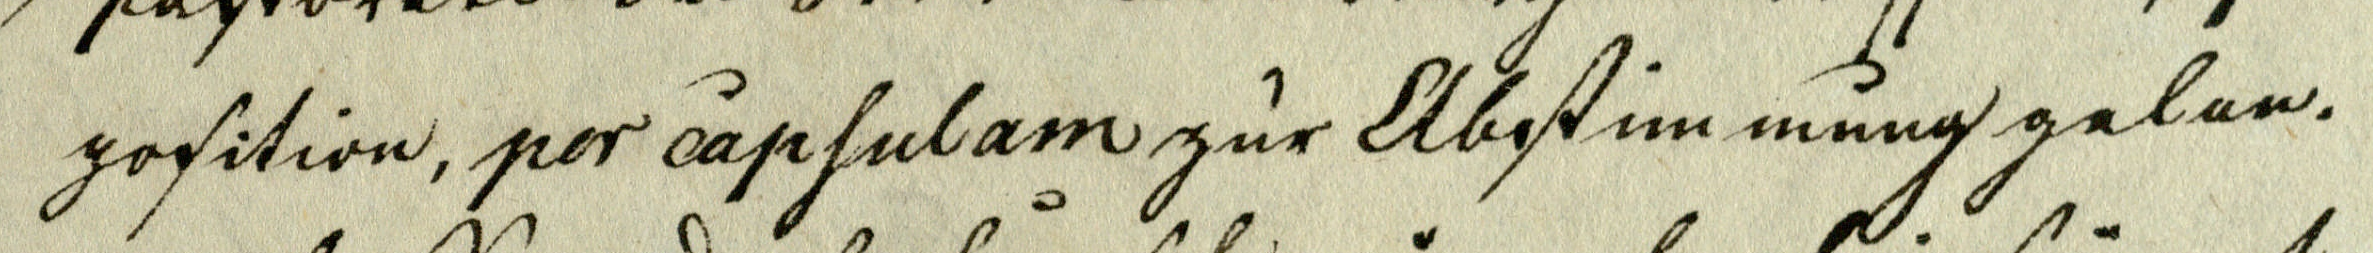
position, per capsulam zur Abstimmung gelan¬
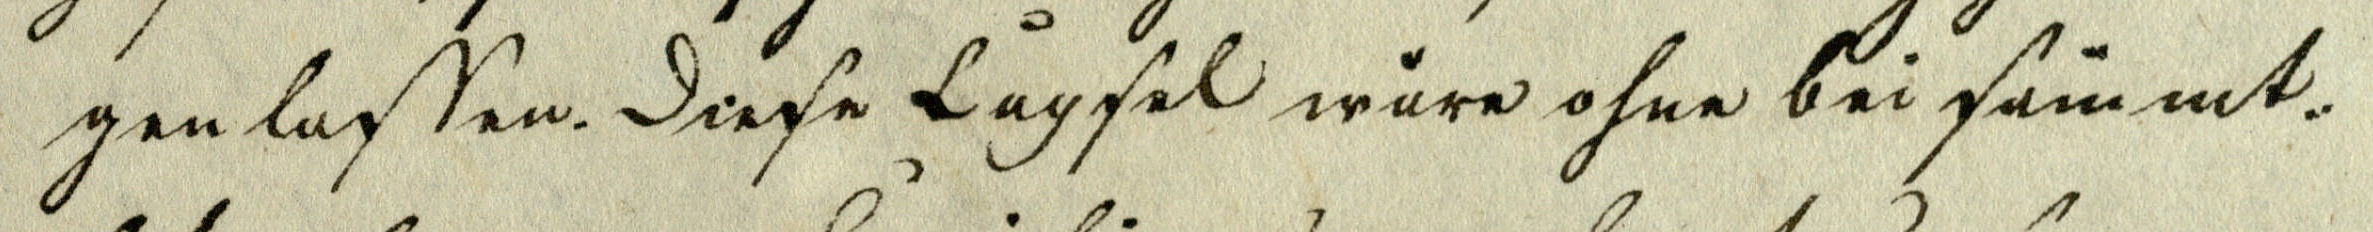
gen lassen. Diese Capsel wäre ohne bei sämmt¬
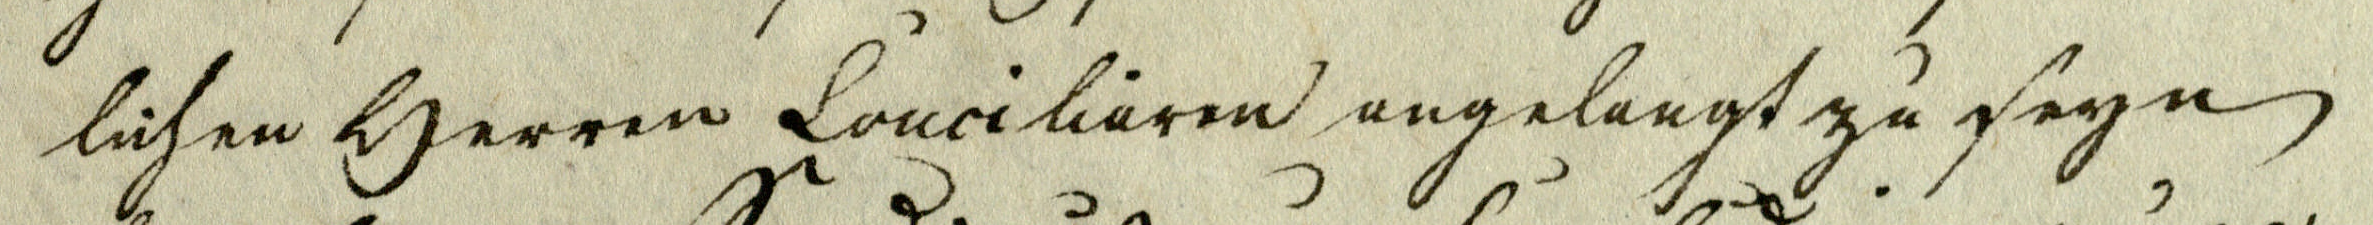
lichen Herren Conciliaren angelangt zu seyn
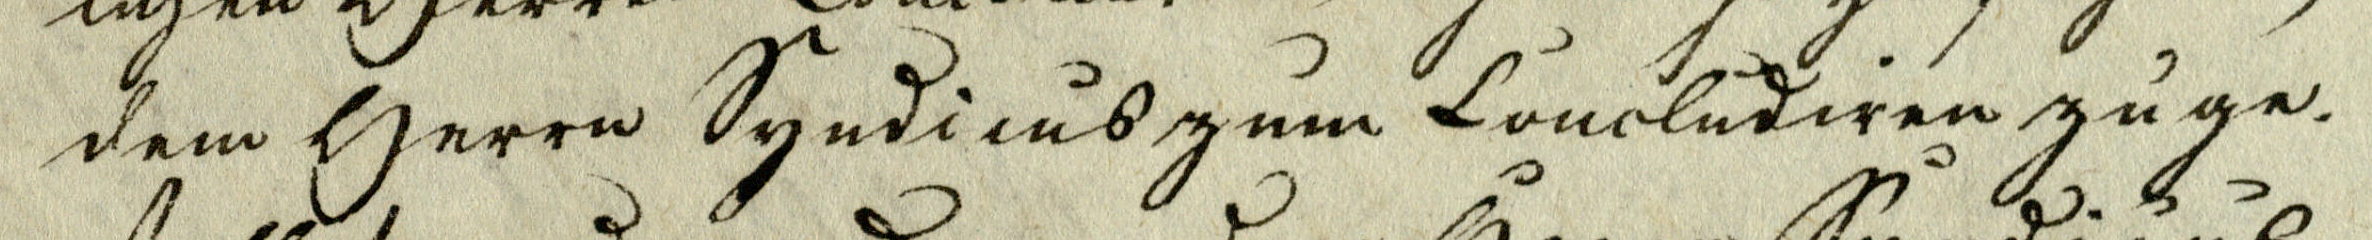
dem Herrn Syndicus zum Concludiren zuge¬
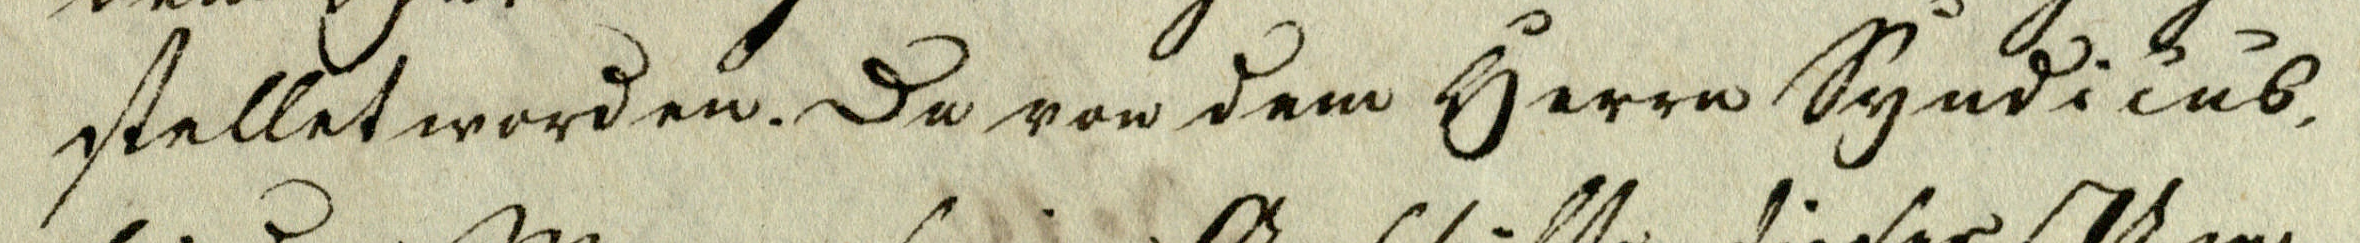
stellet worden. Da von dem Herrn Syndicus
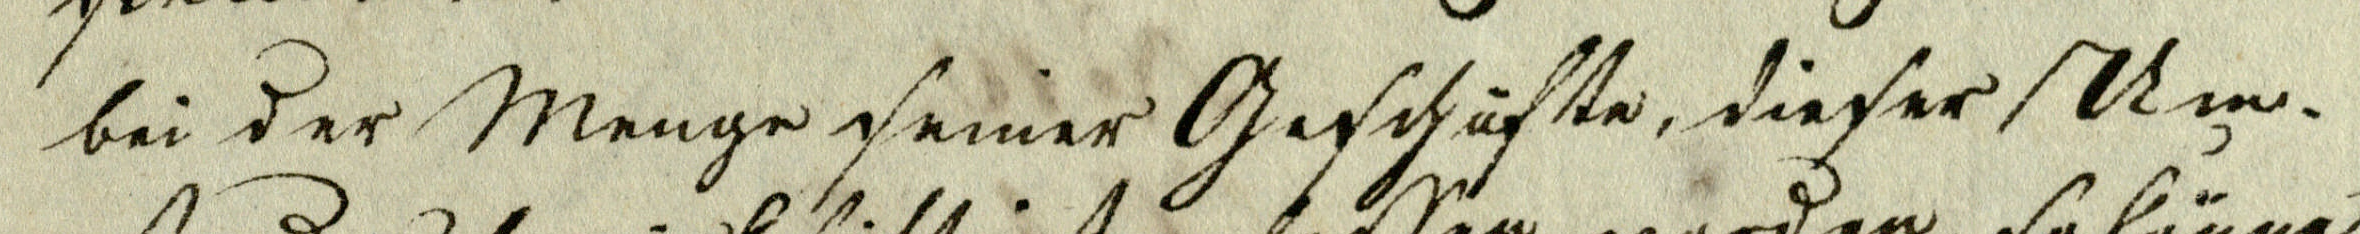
bei der Menge seiner Geschäfte, dieser Um¬
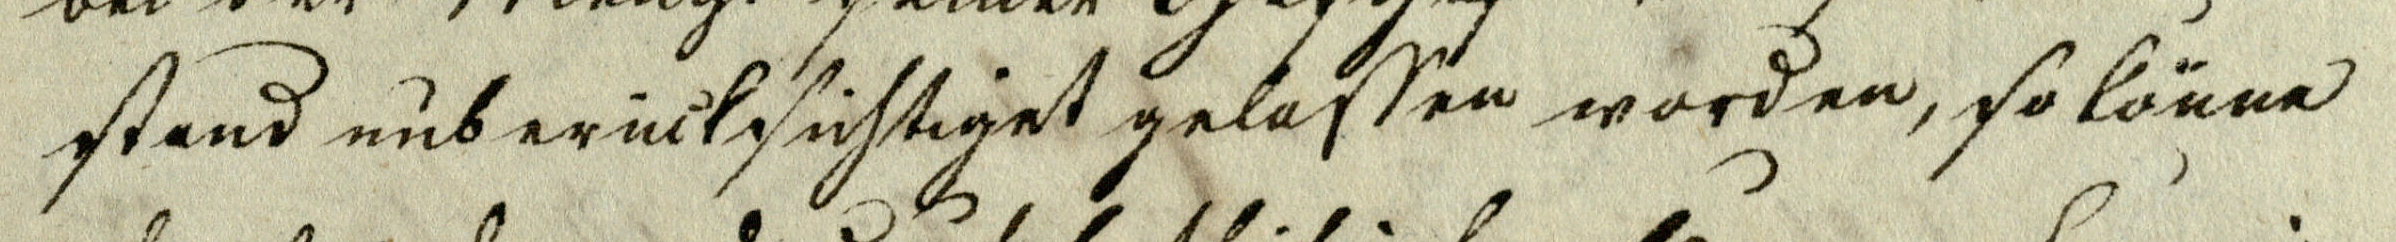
stand unberücksichtiget gelassen worden, so könne
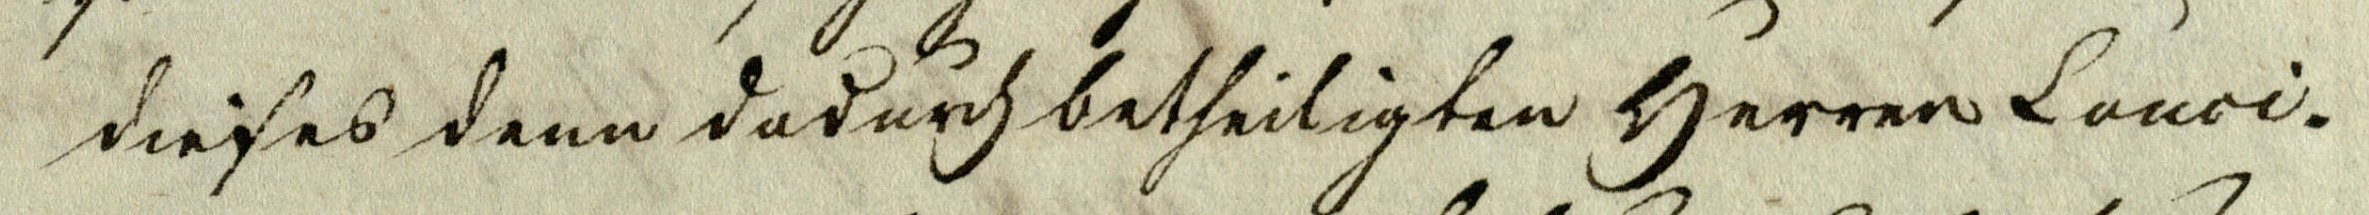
dieses denn dadurch betheiligten Herren Conci¬
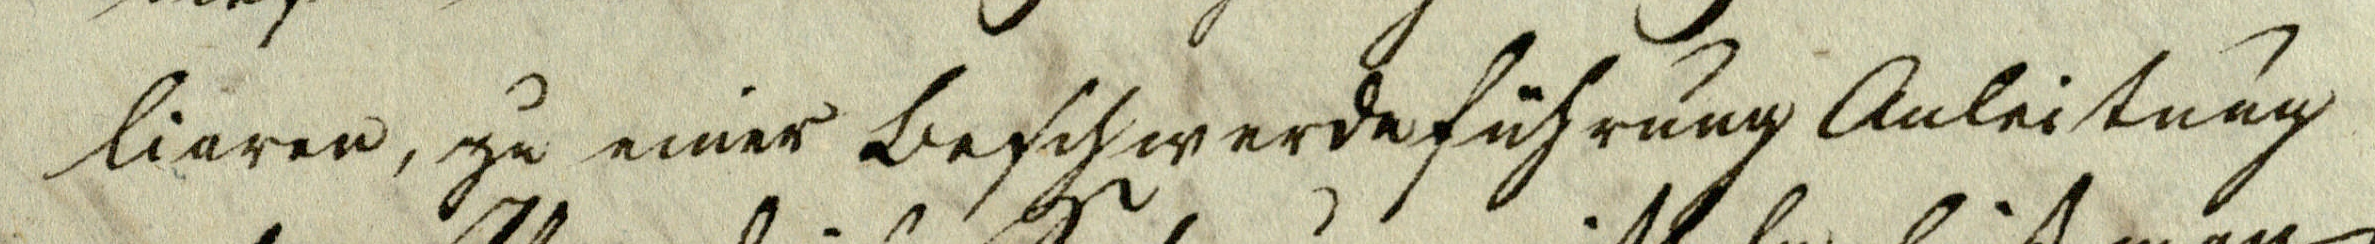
liaren, zu einer Beschwerdeführung Anleitung
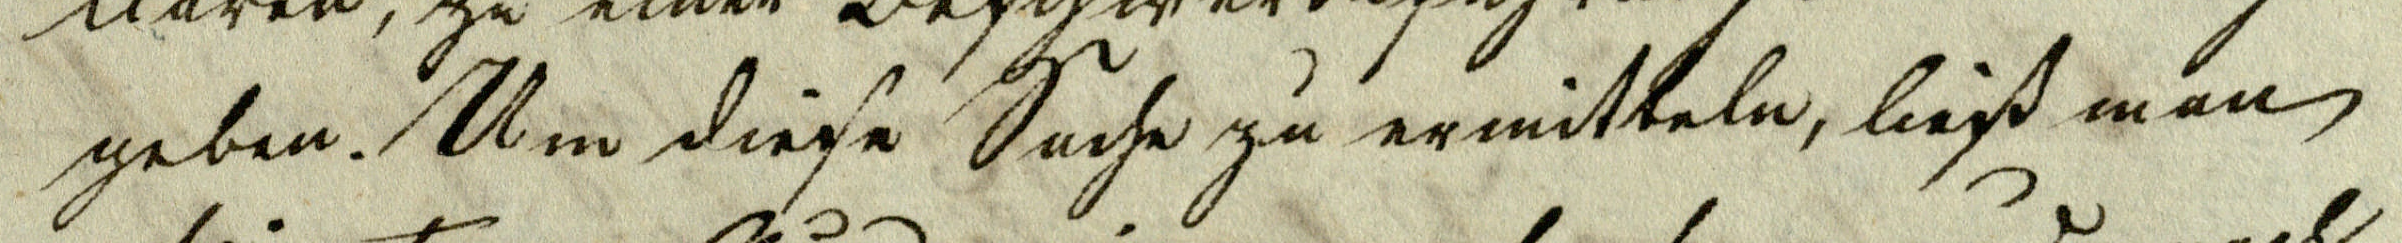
geben. Um diese Sache zu ermitteln, ließ man
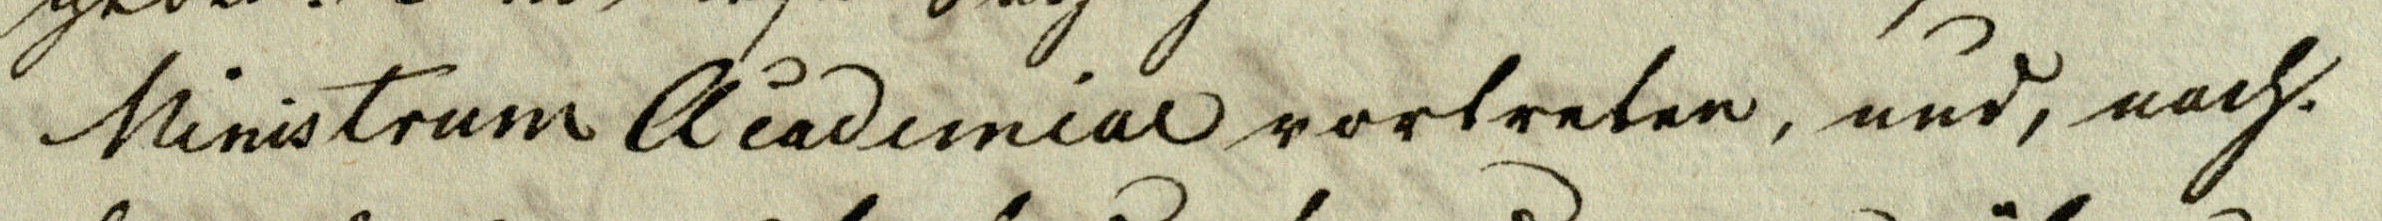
Ministrum Academiae vortreten, und, nach¬
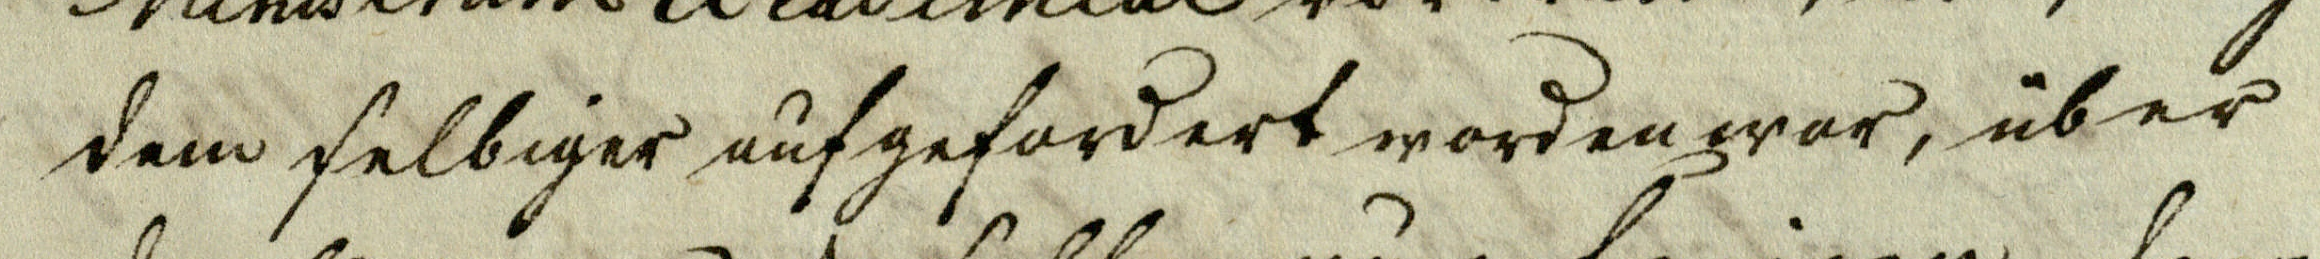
dem selbiger aufgefordert worden war, über
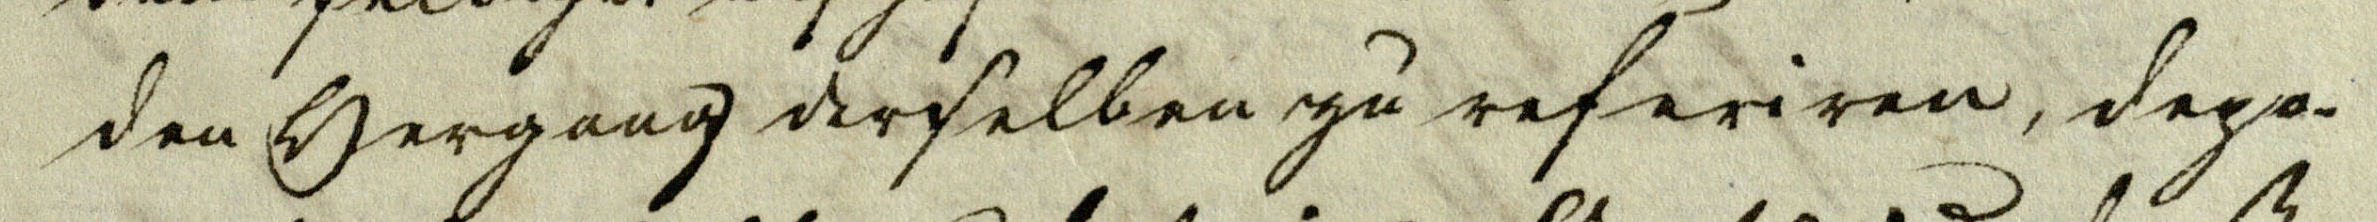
den Hergang derselben zu referiren, depo¬
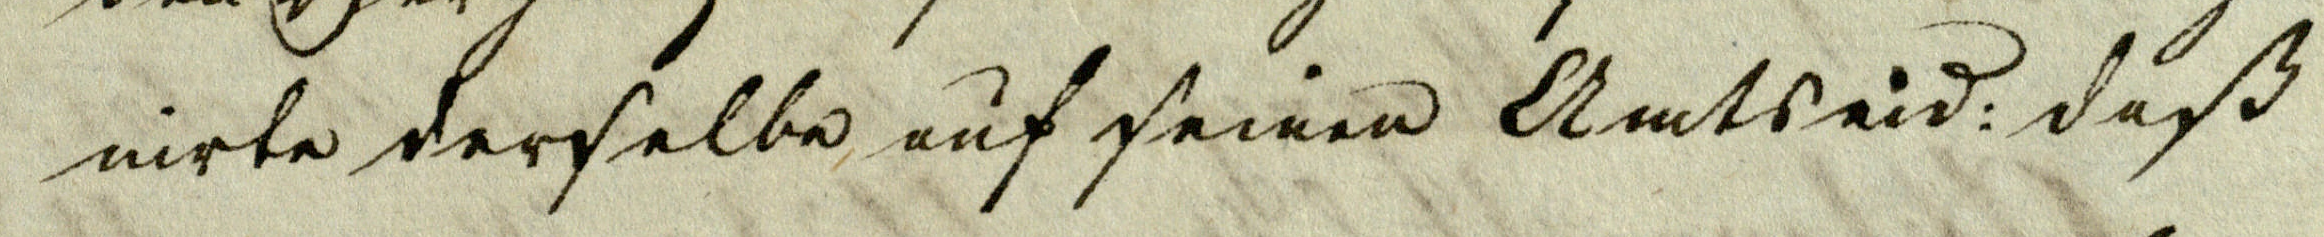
nirte derselbe auf seinen Amtseid: daß
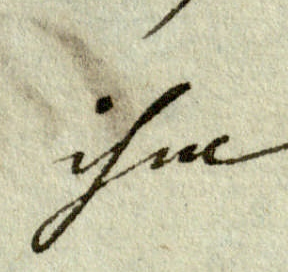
ihm
